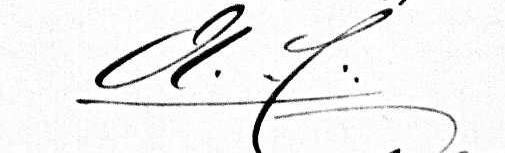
A. E:
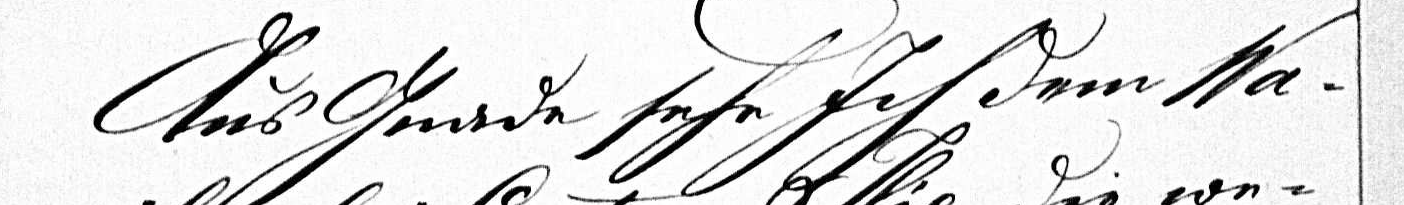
Aus Gnade sehe Jch dem Wa¬
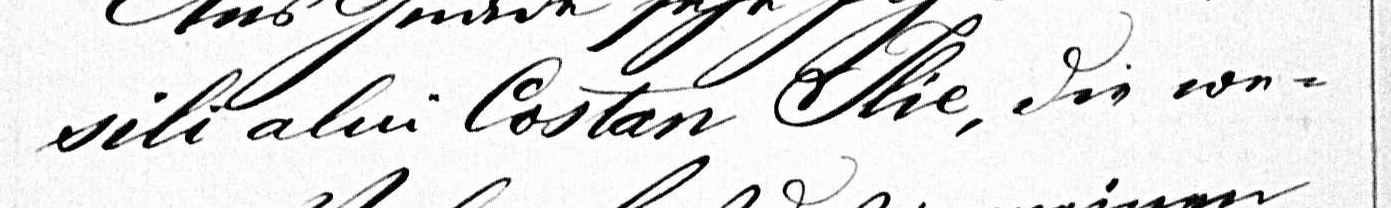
sili alui Costan Jlie, die we¬
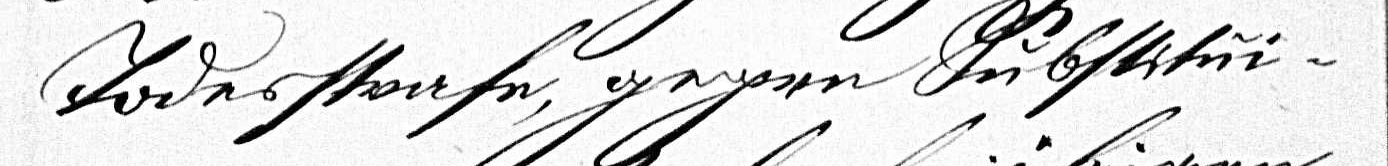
Todesstrafe, gegen Substitui¬
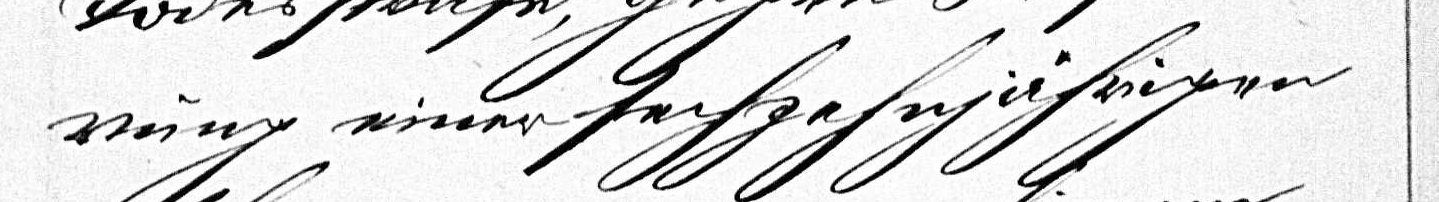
rung einer sechzehnjährigen
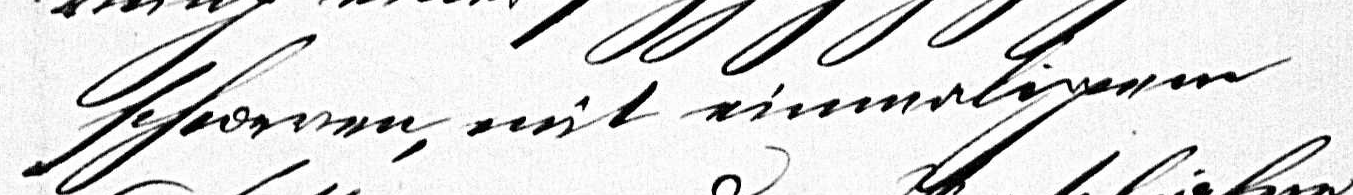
schweren, mit einmaligem
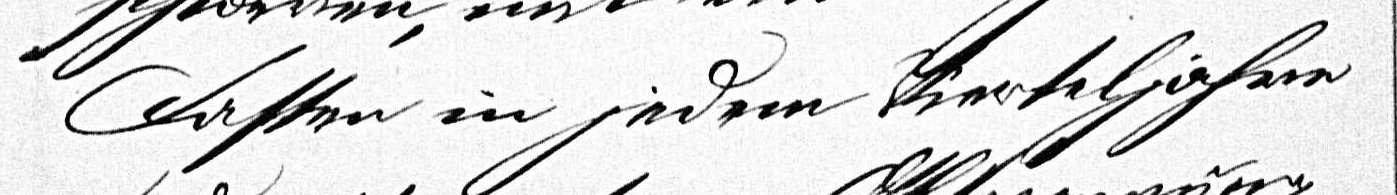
Fasten in jedem Vierteljahre
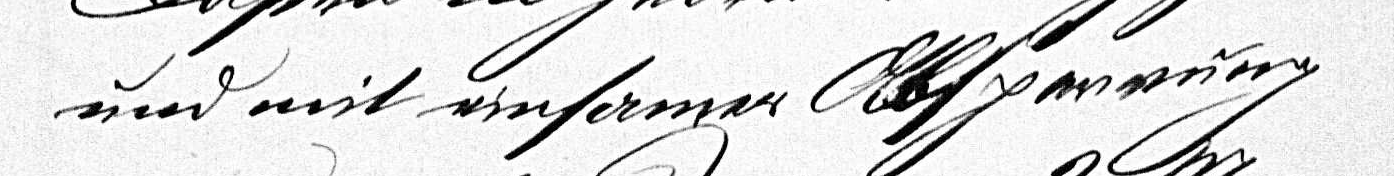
und mit einsamer Absperrung
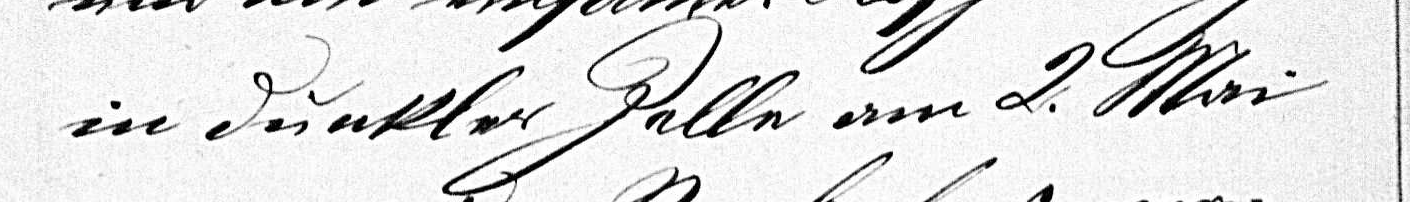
in dunkler Zelle am 2. Mai
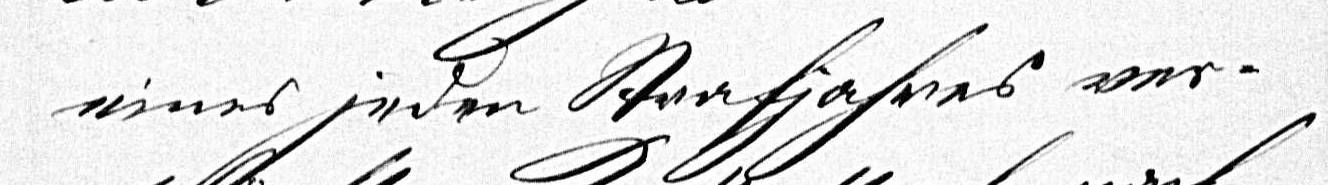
eines jeden Strafjahres ver¬
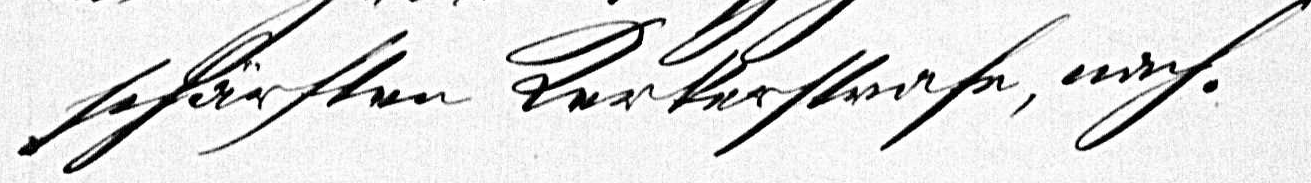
schärften Kerkerstrafe, nach.
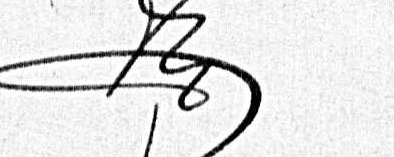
xx
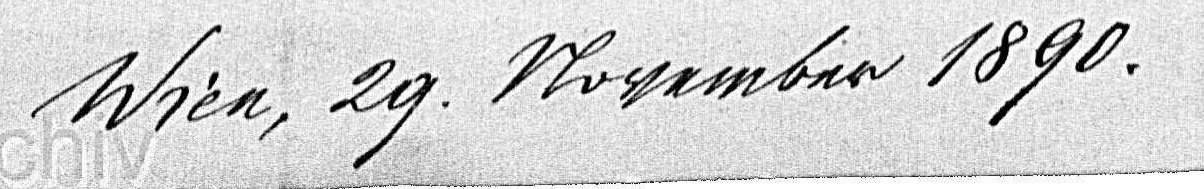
Wien, 29. November 1890.
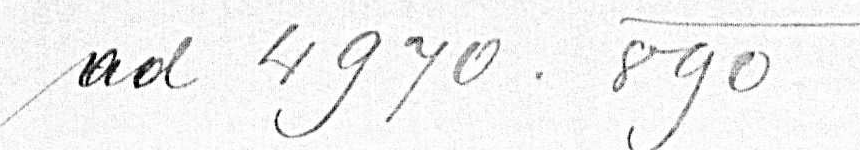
ad 4970. 890
